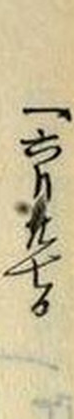一六月廿七日
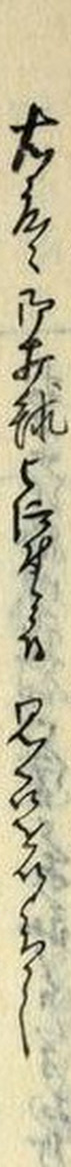右度々御打毬被仰付候ニ付思召を以被下之
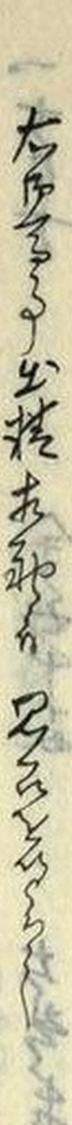右御馬事出精相勤候ニ付思召を以被下之
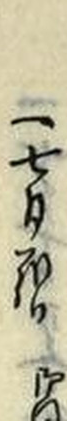一七月朔日
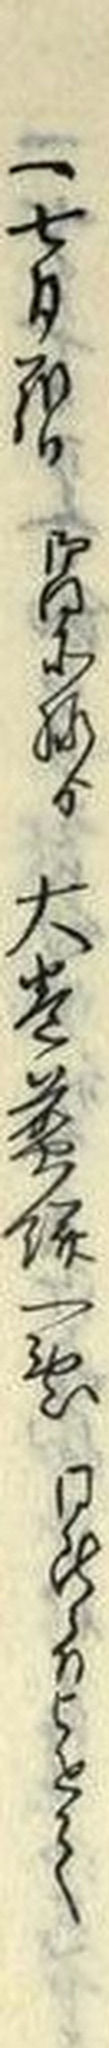御同所様ゟ大巻煎餅一台同断ニ付被進之大奥御用
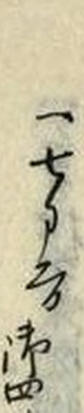一七月二日
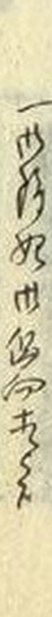御附始御側向等へ被下
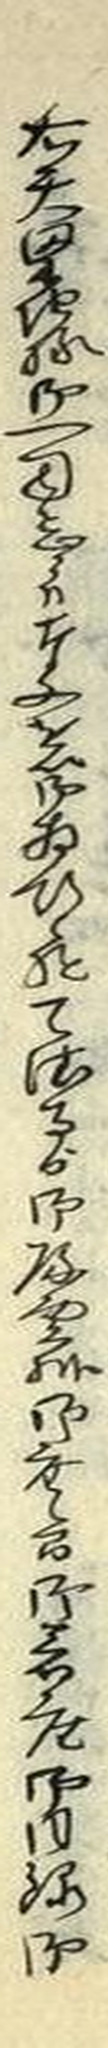右天梁院様御一周忌ニ付奉文を以御拝領被遊天徳寺ゟ御帰殿掛御座之間御着座御目録御
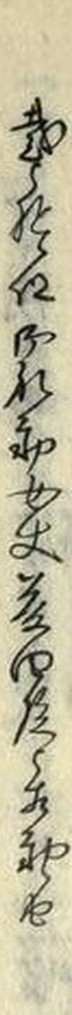戴被遊候但御礼勤女使藤田殿被相勤候由

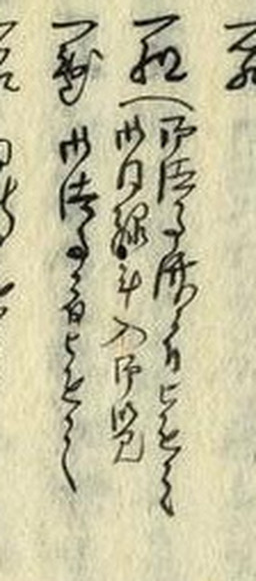御目録斗入御覧
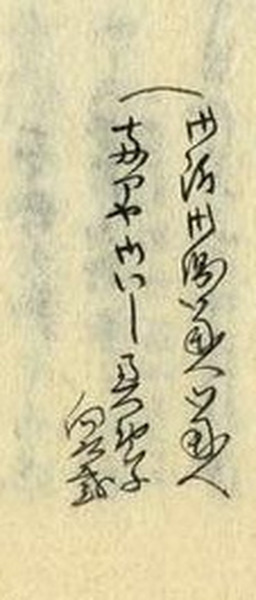両部屋内いし奥台子
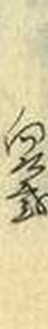向頂戴
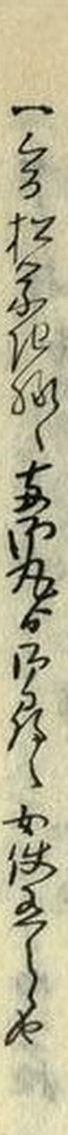一今日松栄院様へ両御丸ゟ御尋之女使有之候由
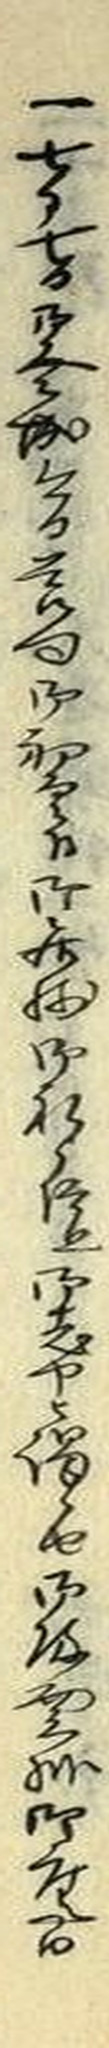一七月七日御登城今日節句御初而ニ付御居残御礼被仰上御老中被謁候由御帰殿掛御座之間
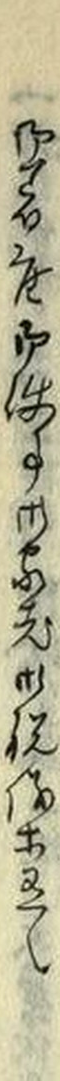御着座御使事御家老御祝儀等有之
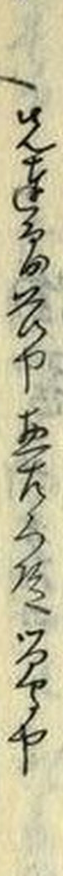先達而ゟ谷中惣左衛門殿留守中
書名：少傅日録抄（斉善付側向頭取日記、在府）
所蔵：福井県文書館 Fukui Prefectural Archives
